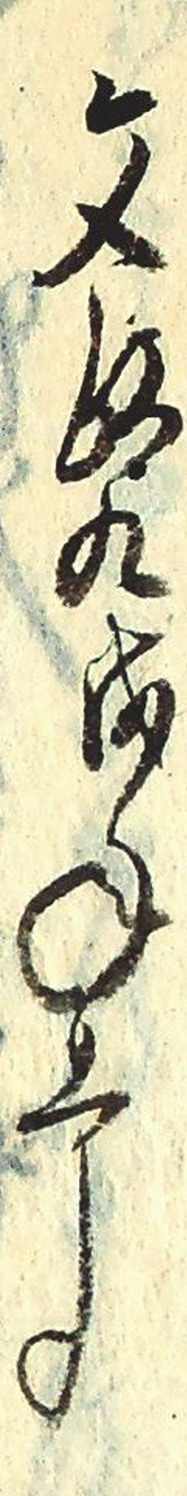文政九戌年十一月
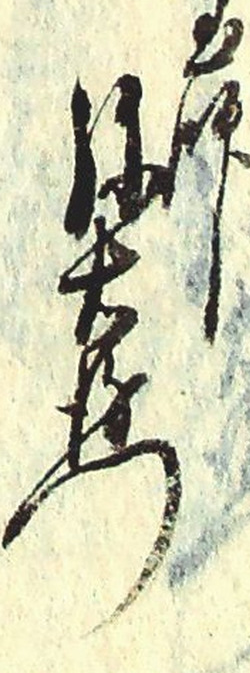弥右衛門
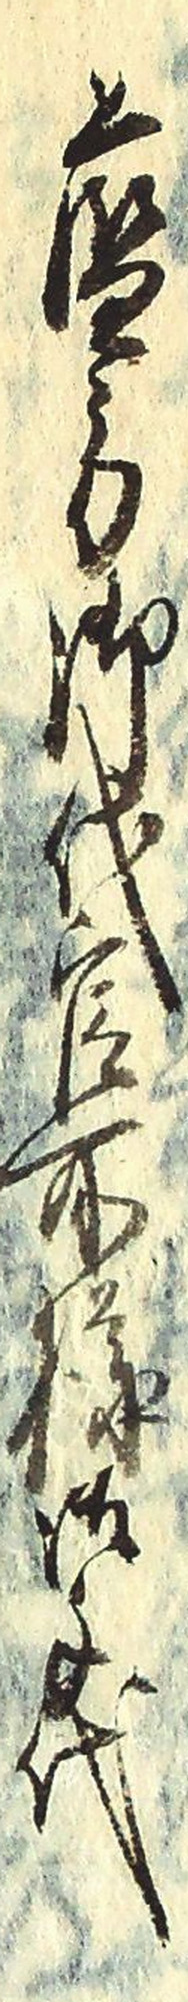藍方御代官所様御手代
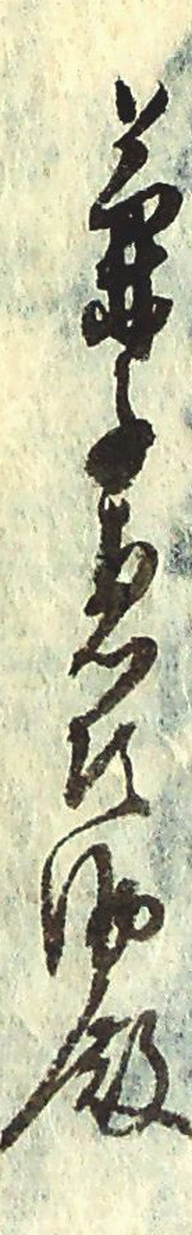兼子恵次助殿
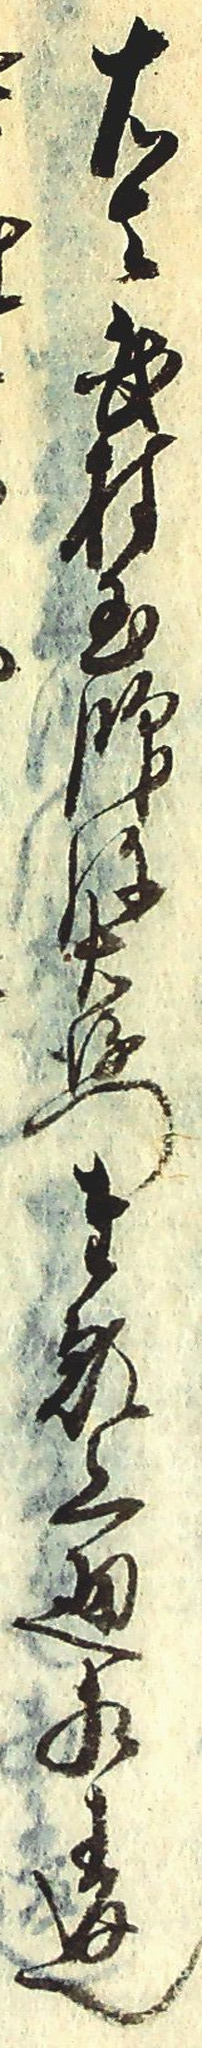右は当村玉師弥右衛門奉願上通相違
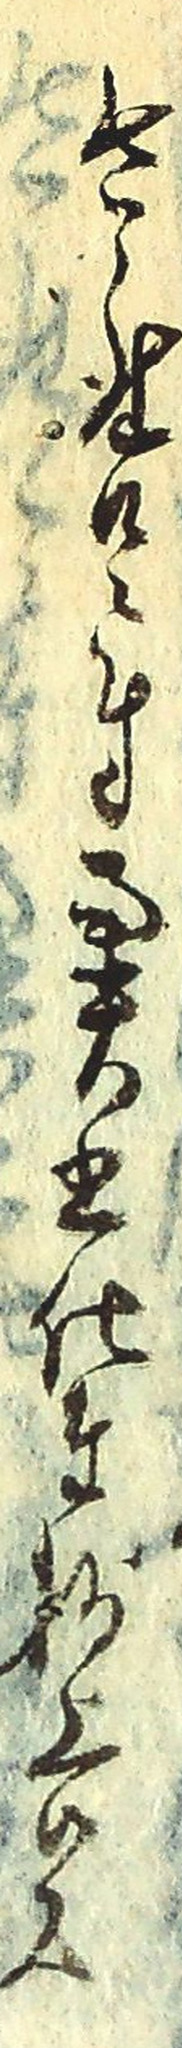無御座候に付奥書仕奉指上候以上
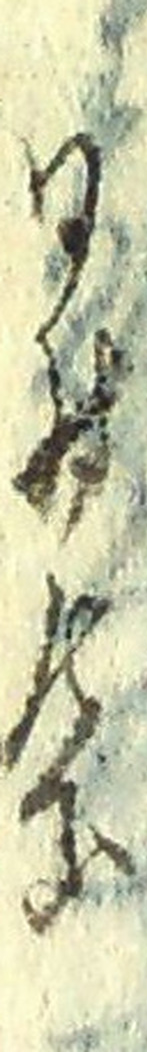同村庄屋
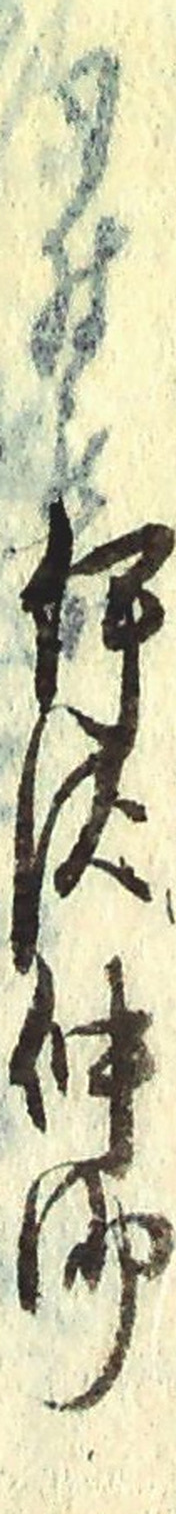伊沢仲助
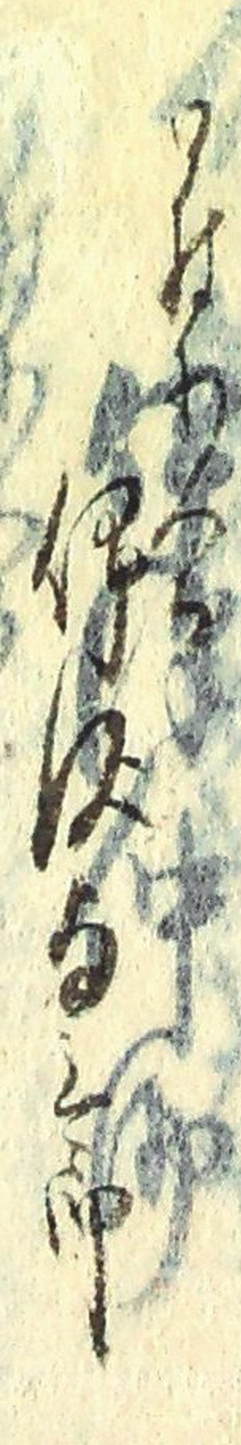伊沢与三郎
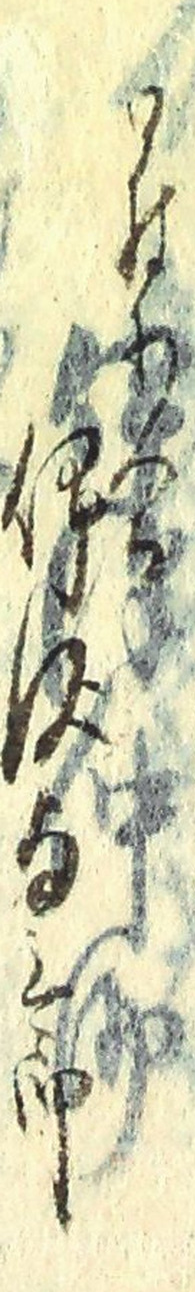伊沢与三郎
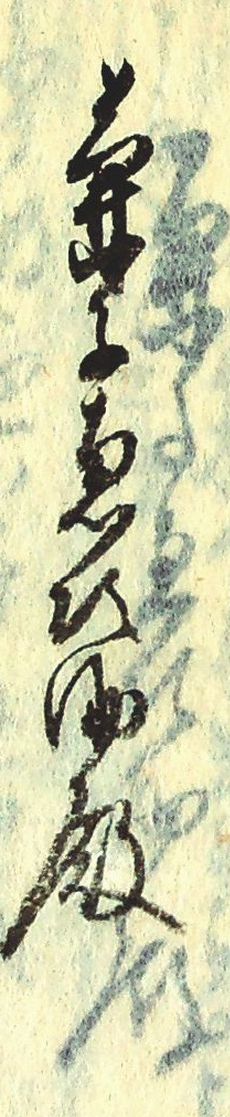兼子恵次助殿
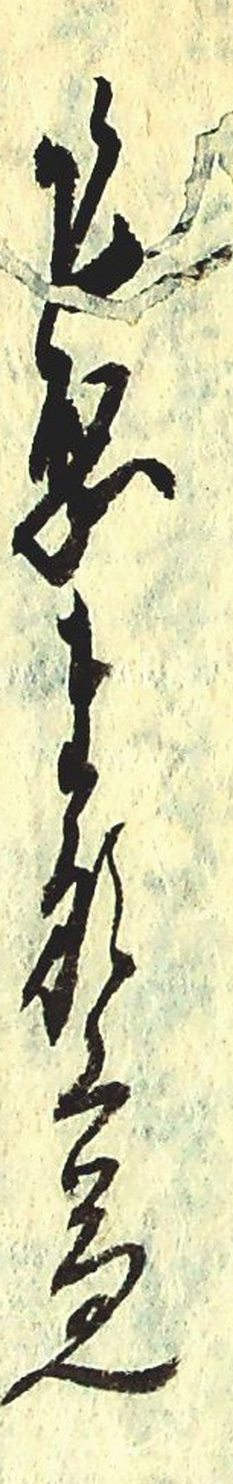乍恐奉願上覚
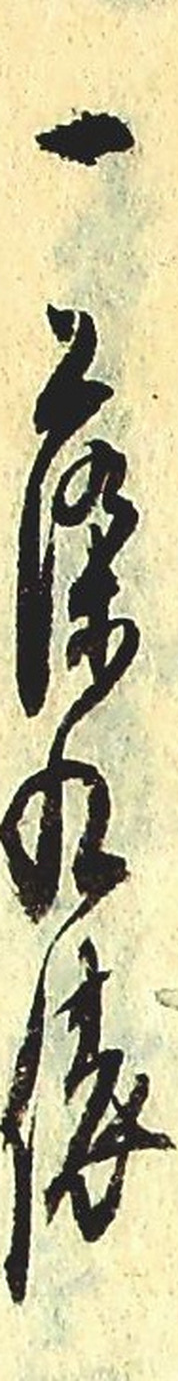一蒅九俵
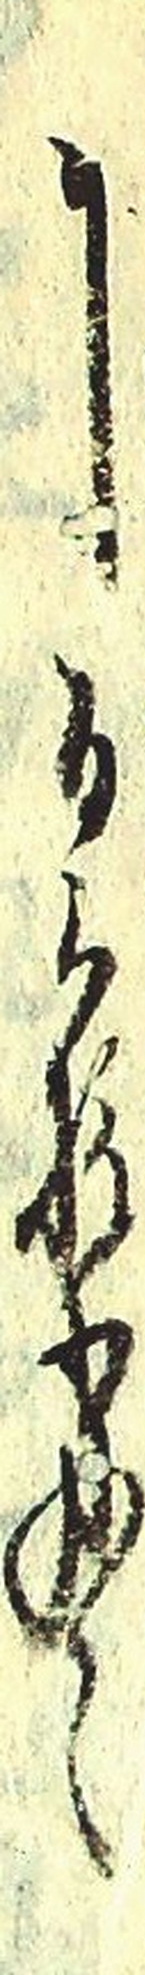正百三拾五貫
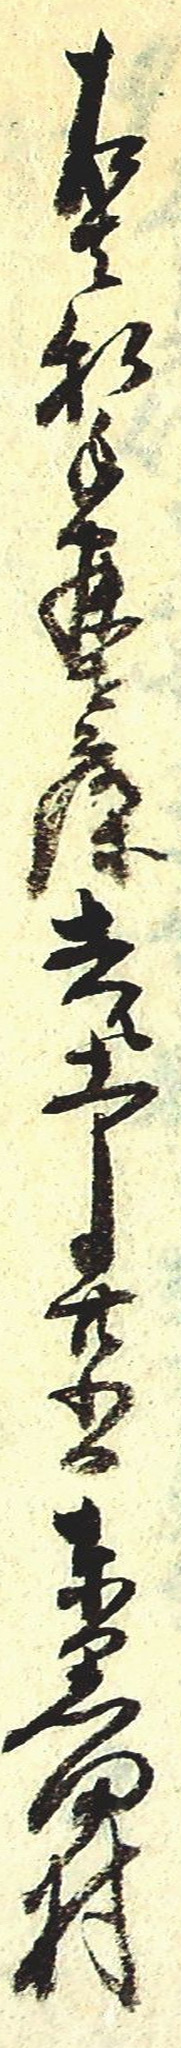右は私手寐せ蒅去る十一月廿五日東黒田村
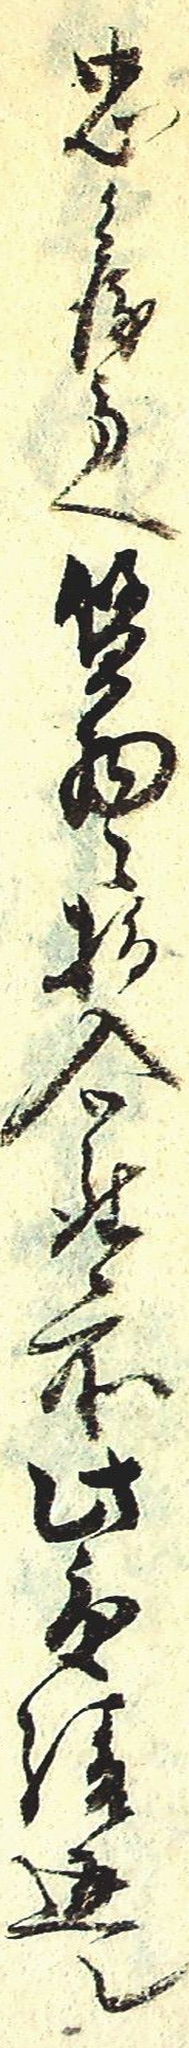忠兵衛方へ質物に指入御座候所此度請返し
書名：諸御願書控(弐番）
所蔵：鳴門教育大学 Naruto University of Education
